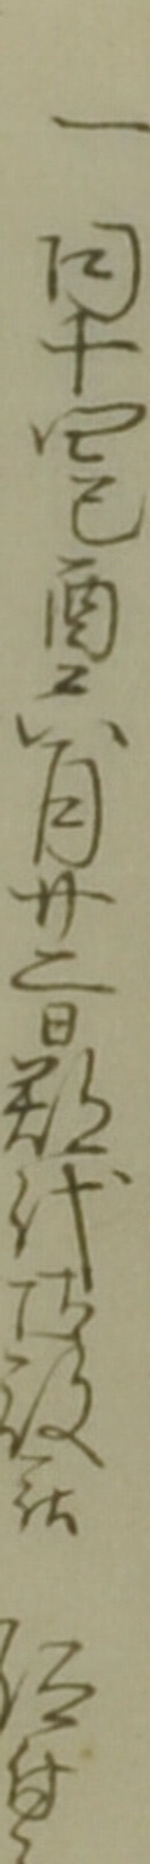一同十四己寅六月廿二日郡代御役被仰付候
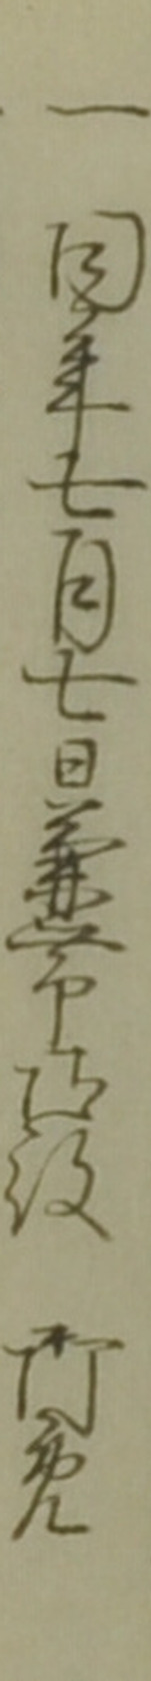一同年七月七日兼帯御役御免
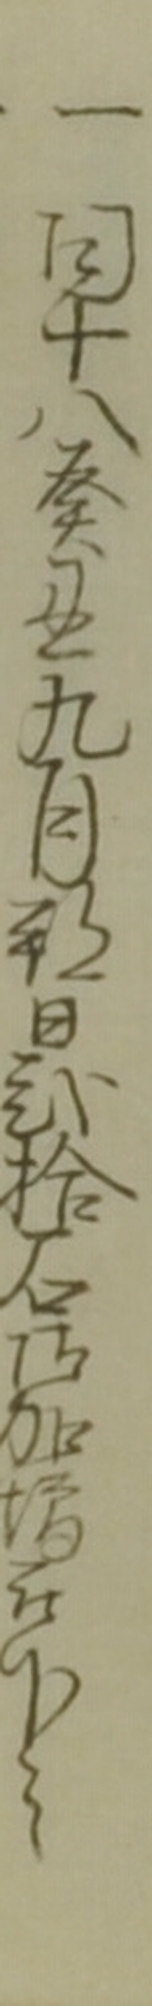一同十八癸丑九月朔日弐拾石御加増被下候
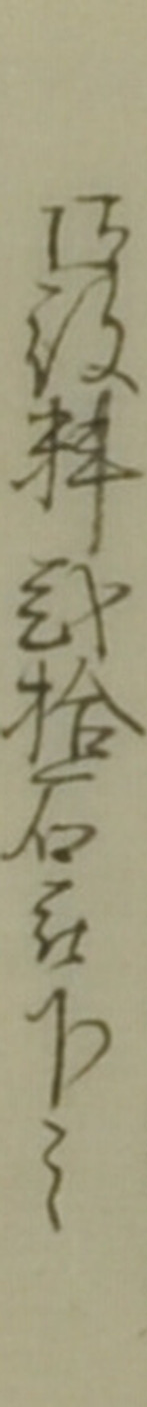御役料弐拾石被下候
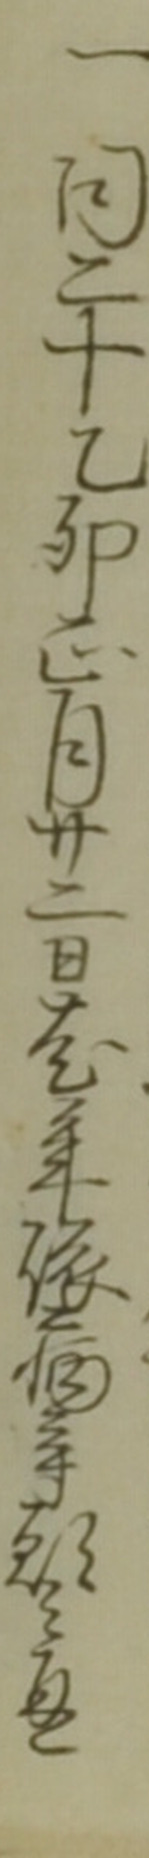一同二十乙卯正月廿二日老年依病気願之通
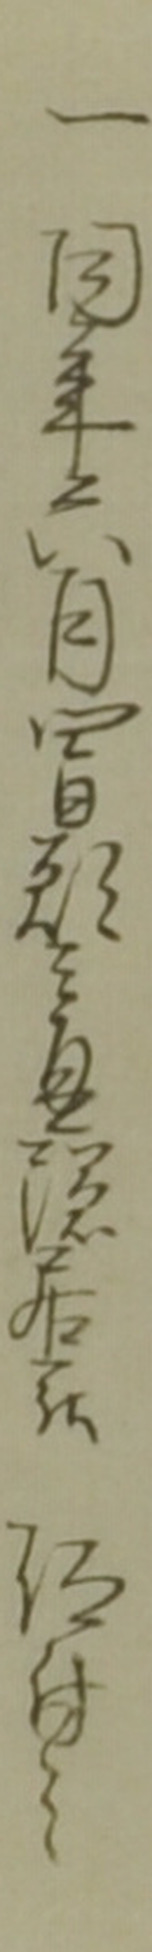一同年六月四日願之通隠居被仰付候
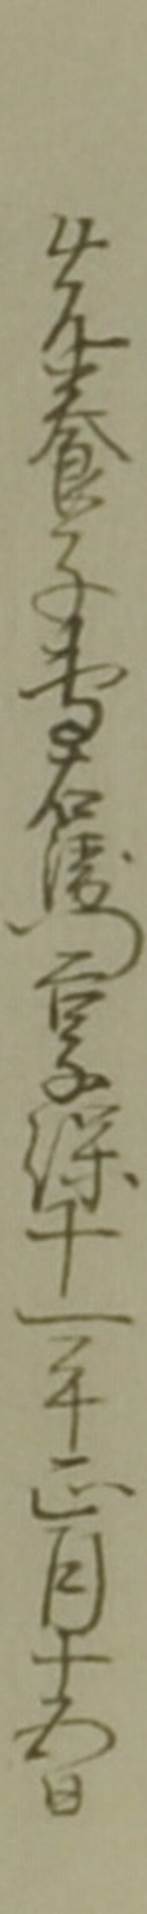先養子専右衛門享保十一午正月十五日
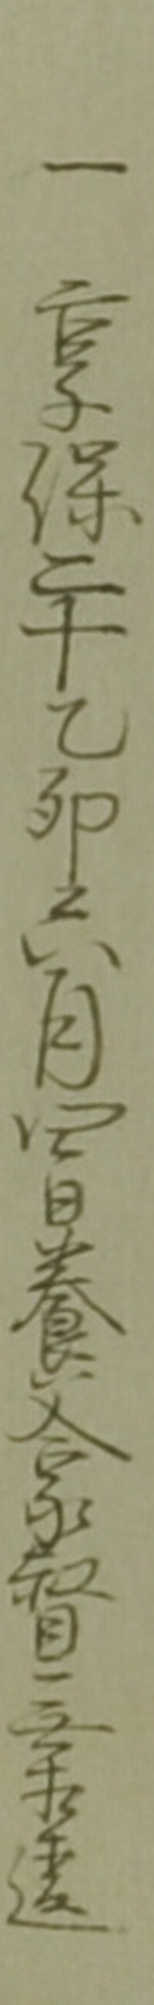一享保二十乙卯六月四日養父家督無相違
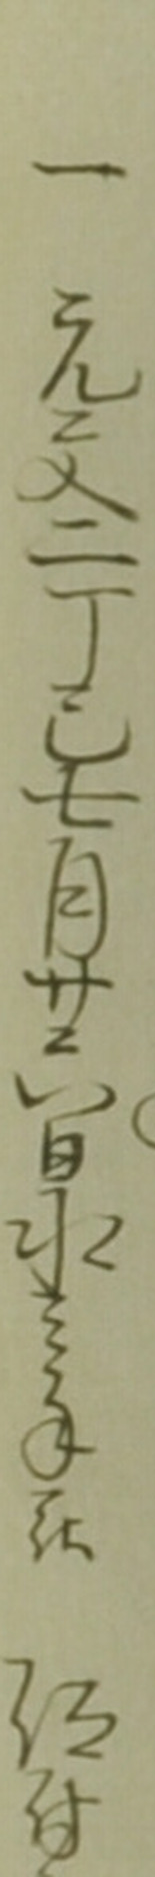一元文二丁巳七月廿六日水主手被仰付候
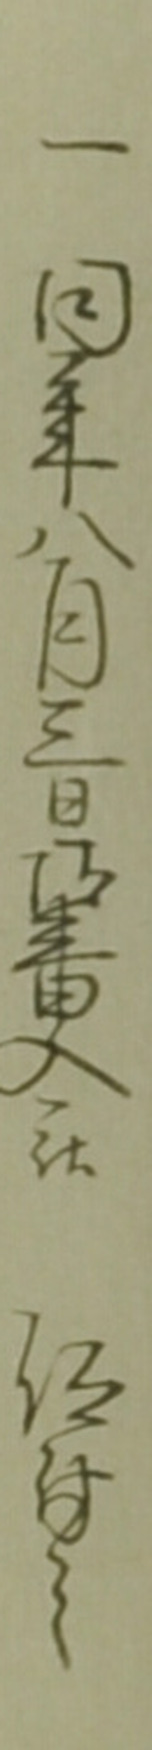一同年八月三日御番入被仰付候

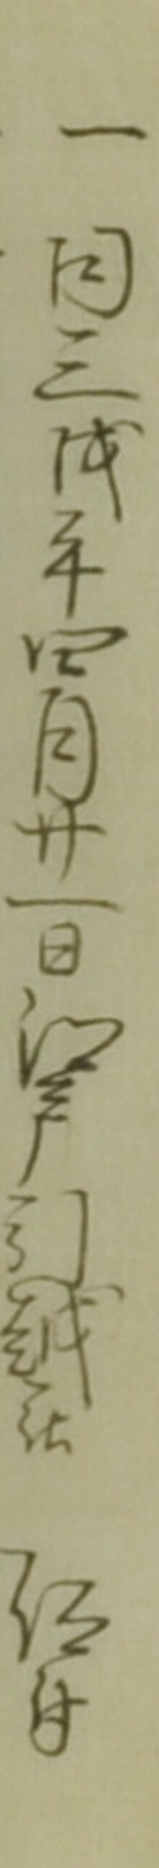一同三戊午四月廿一日江戸引越被仰付
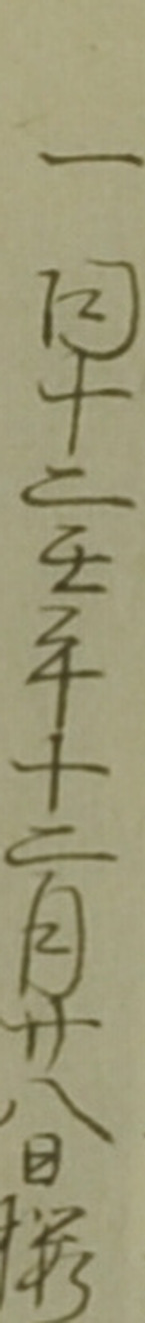一同十二壬午十二月廿八日桜田
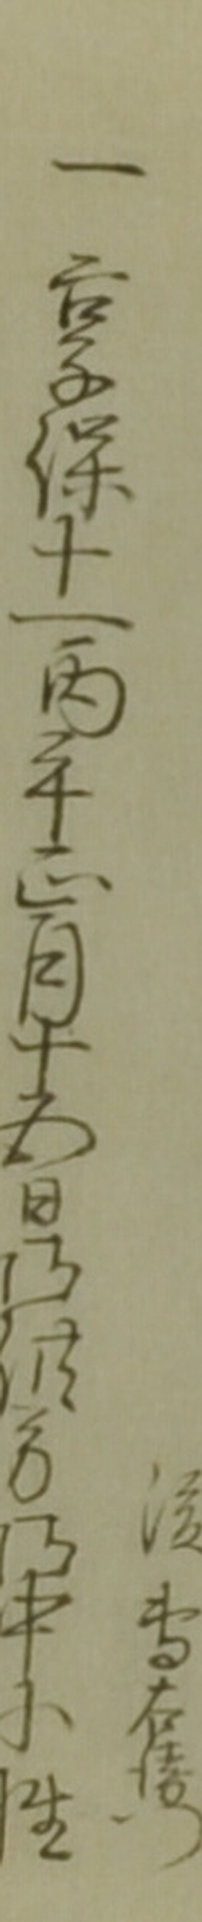一享保十一丙午正月十五日御供方中小性
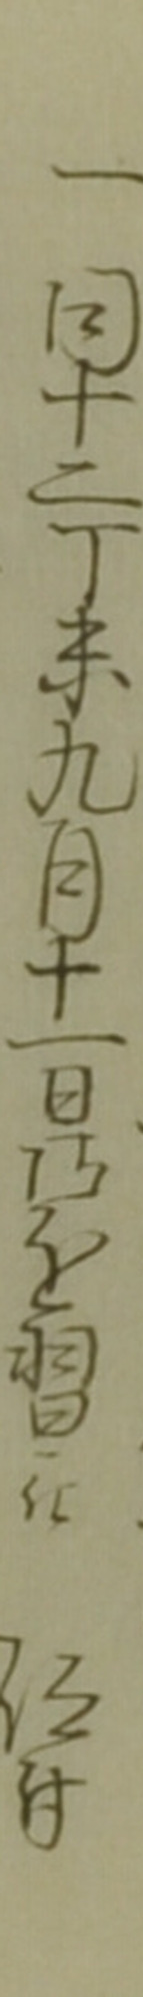一同十二丁未九月十一日御近習被仰付
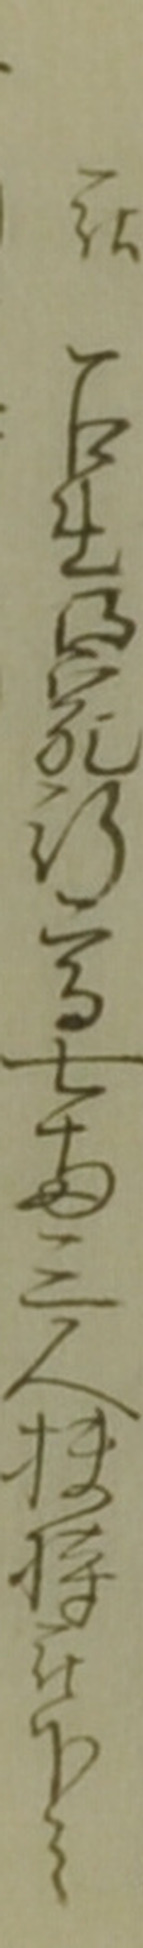被召出御宛行高七両三人扶持被下候
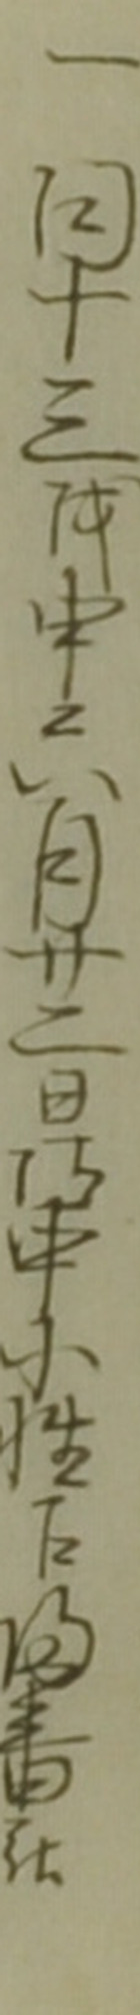一同十三戊申六月廿二日御中小性江帰番被
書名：給人諸士勤仕録（三）
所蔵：伊那市立高遠町図書館・合同会社AMANE
